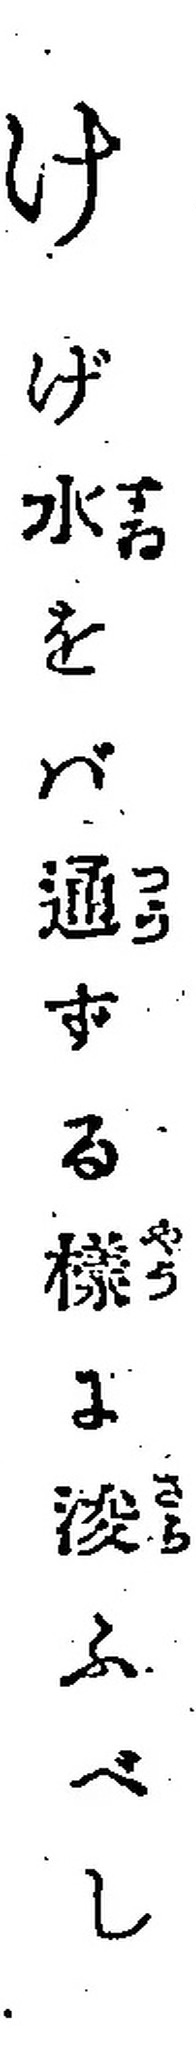けげ水をば通ずる様に浚ふべし
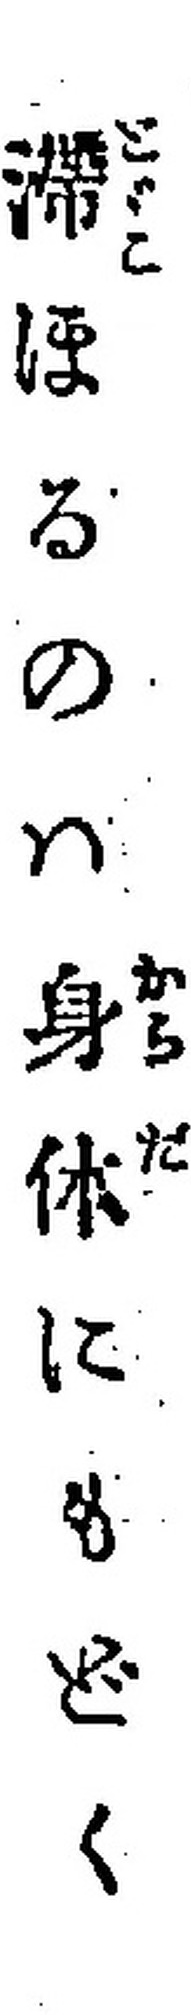滞ほるのは身体にもどく
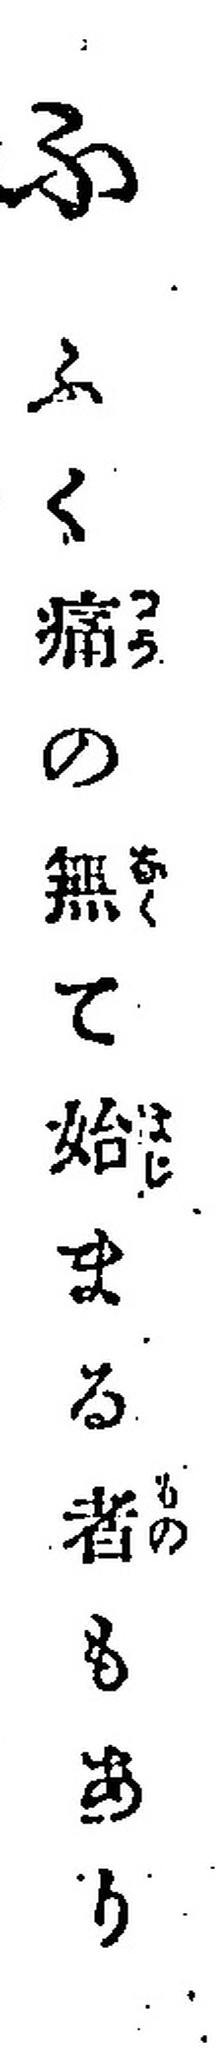ふふく痛の無て始まる者もあり
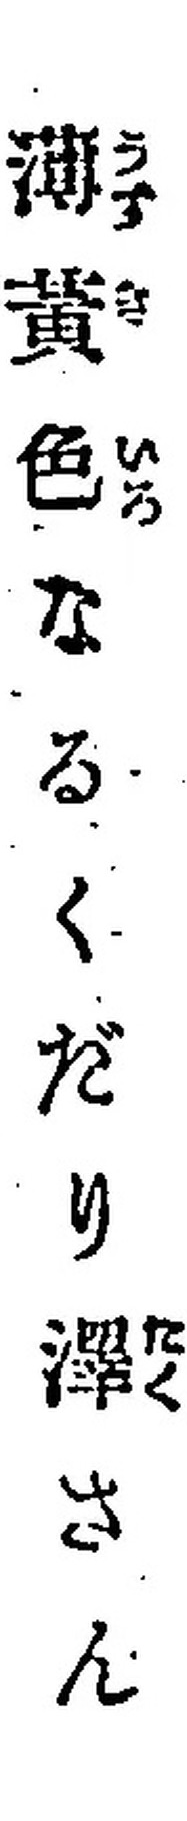薄黄色なるくだり澤さん
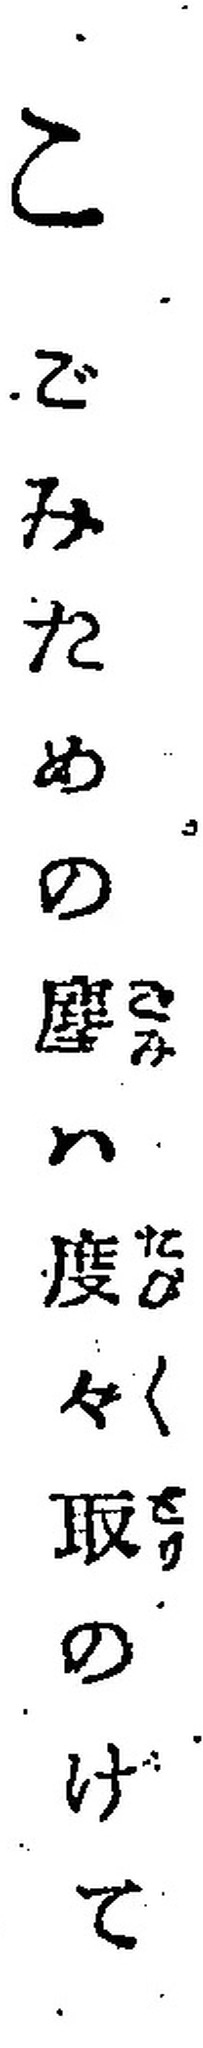こごみための塵は度々取のけて
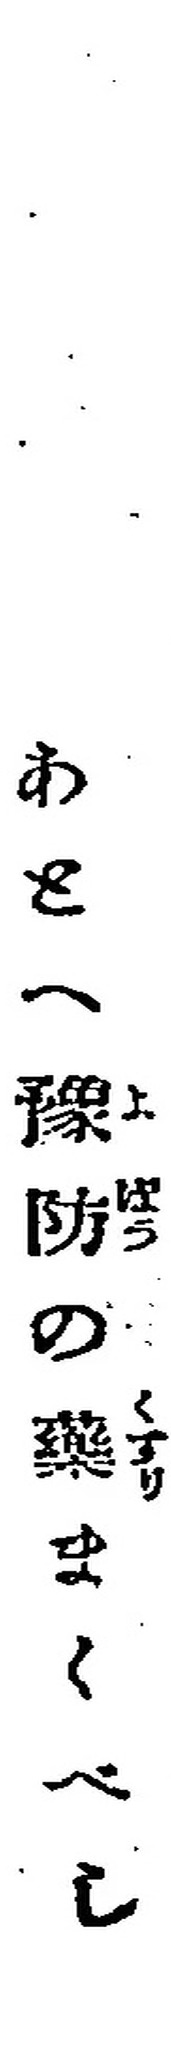あとへ豫防の藥まくべし
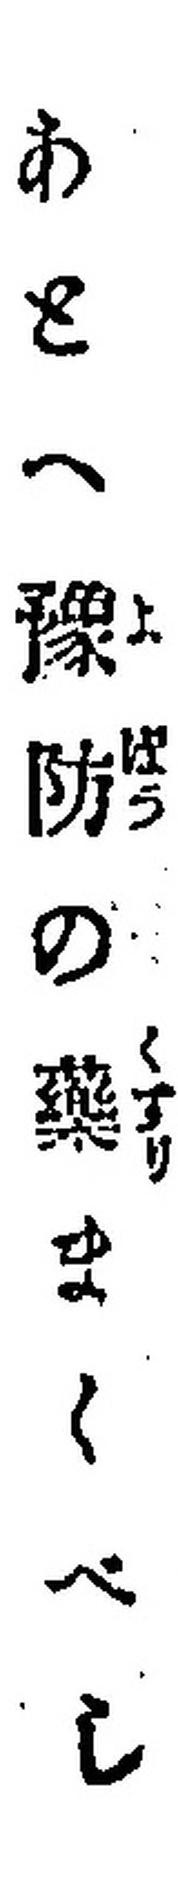あとへ豫防の藥まくべし
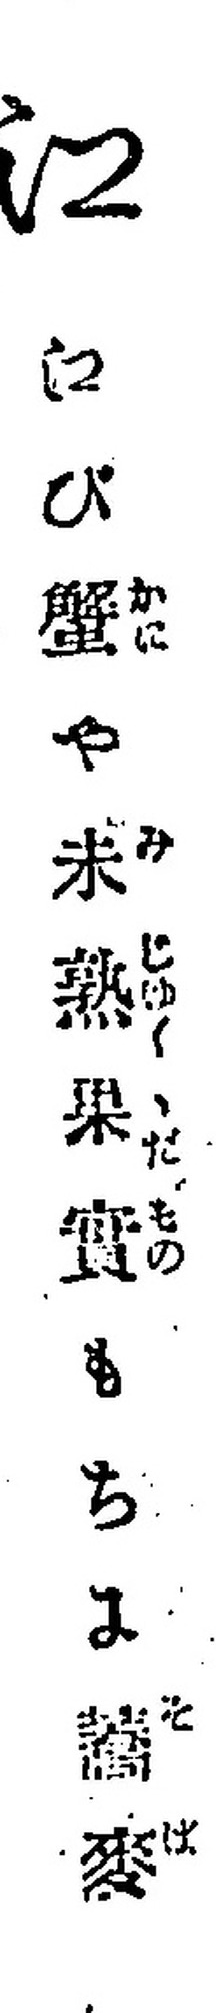ええび蟹や未熟果實もちに蕎麥
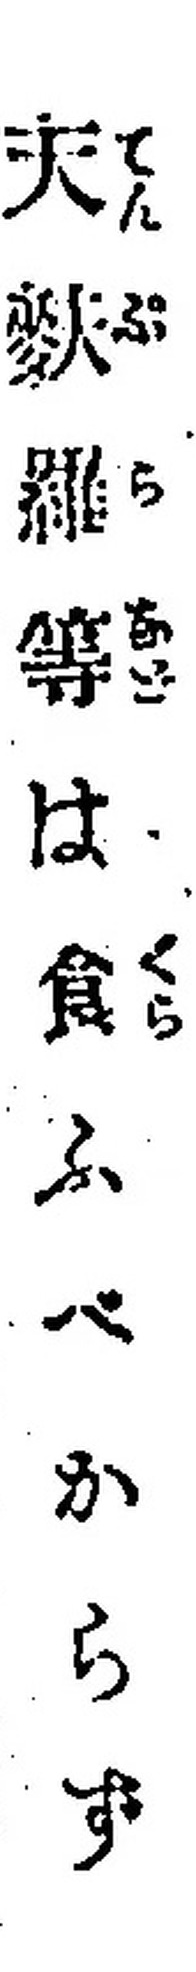天麩羅等は食ふべからず

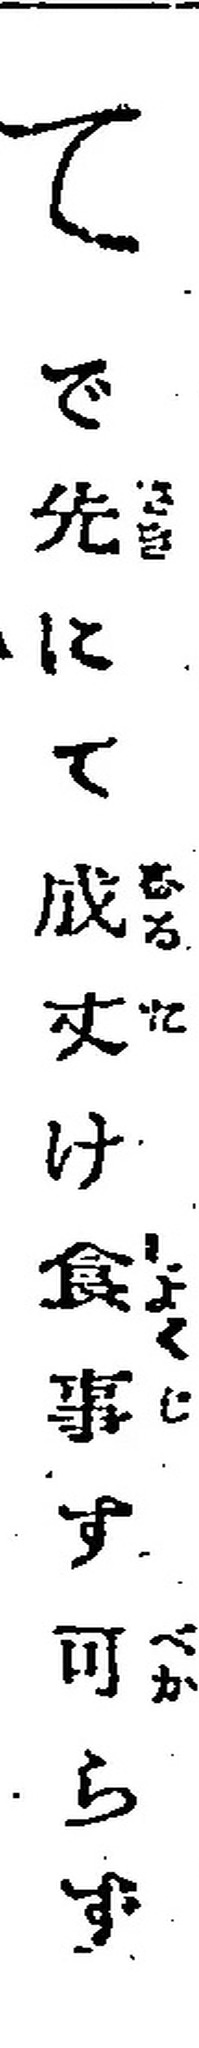てで先にて成丈け食事す可らず
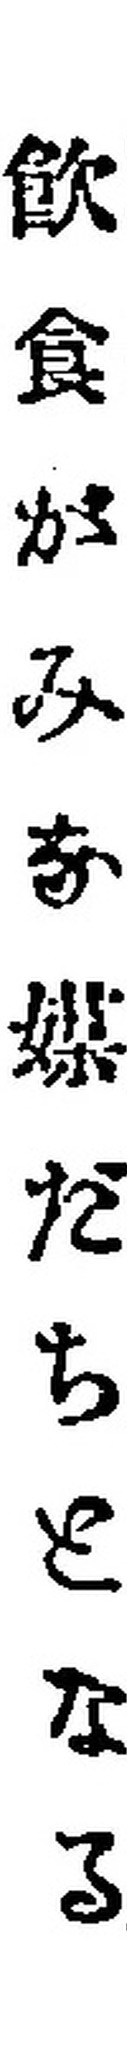飲食がみな媒だちとなる
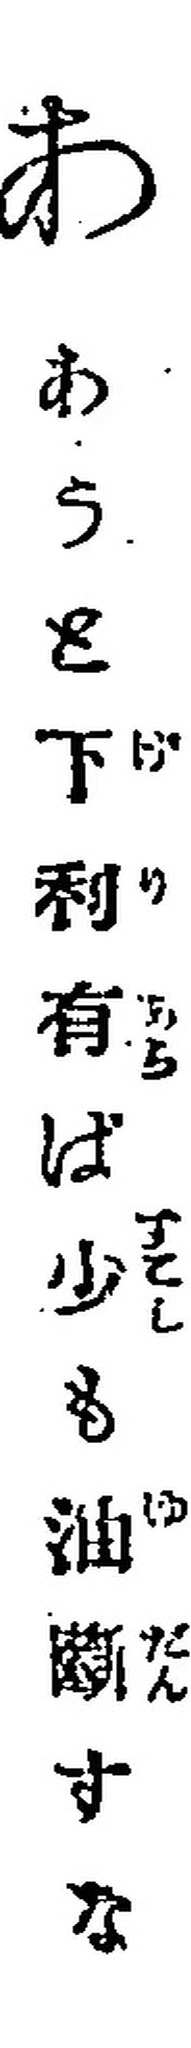ああうと下利有ば少も油断すな
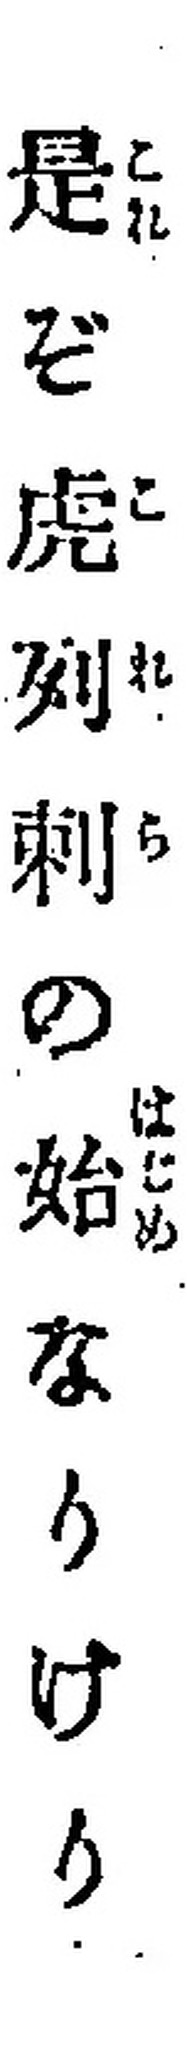是ぞ虎列刺の始なりけり
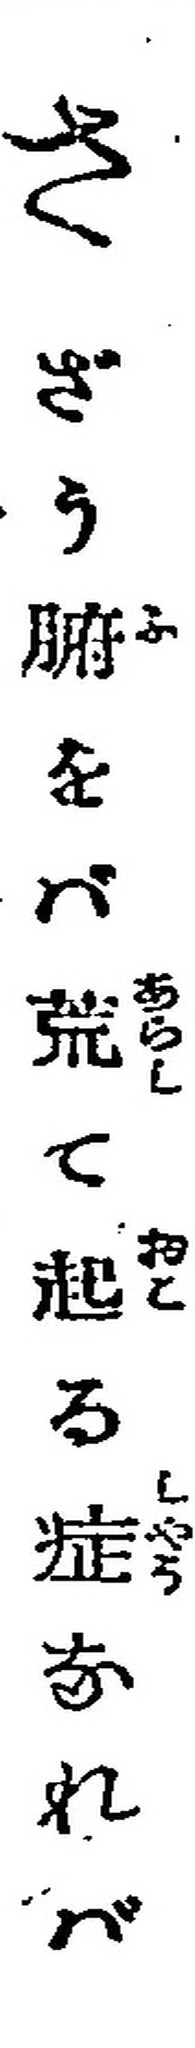さざう腑をば荒て起る症なれば
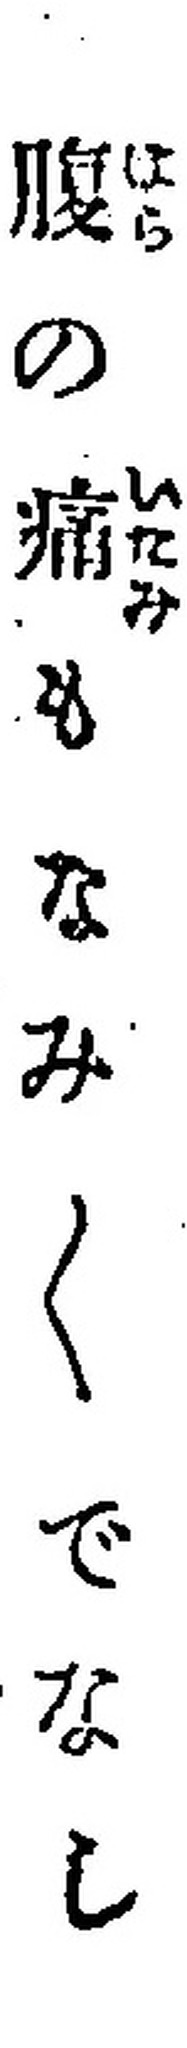腹の痛もなみ〳〵でなし
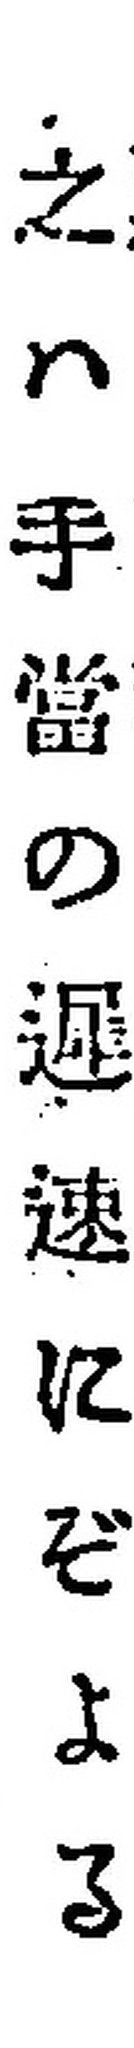之は手當の遅速にぞよる
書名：新撰暑中養生法 : 附・コレラ予防歌
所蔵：国立国会図書館 National Diet Library, JAPAN
